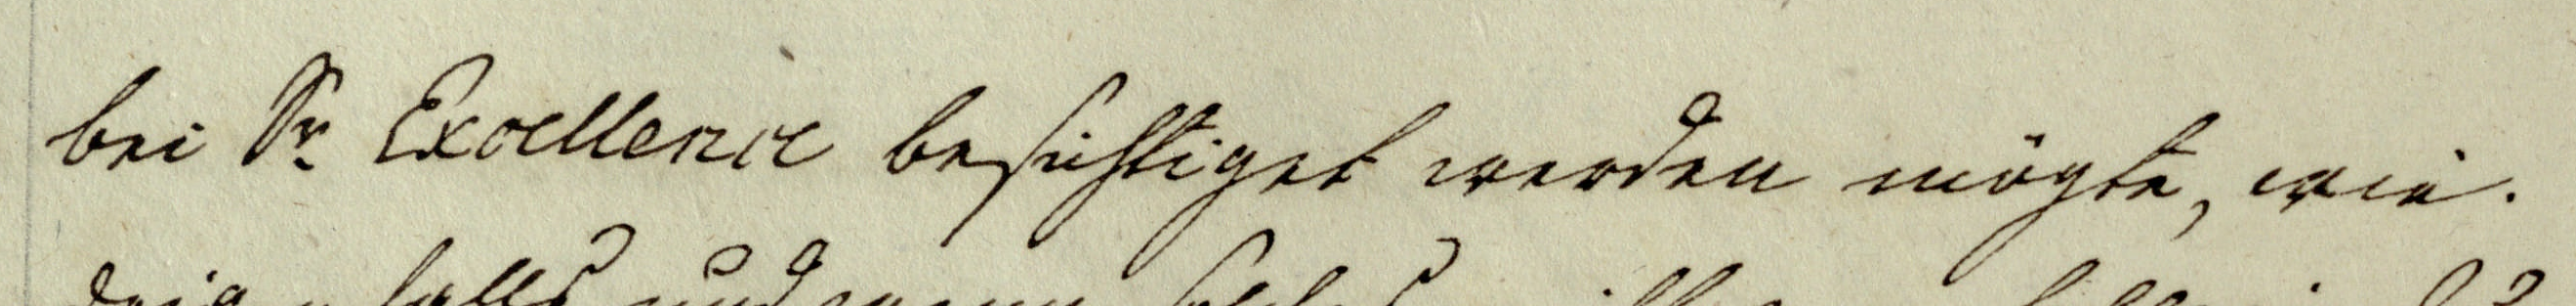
bei Sr Excellence besichtiget werden mögte, wie
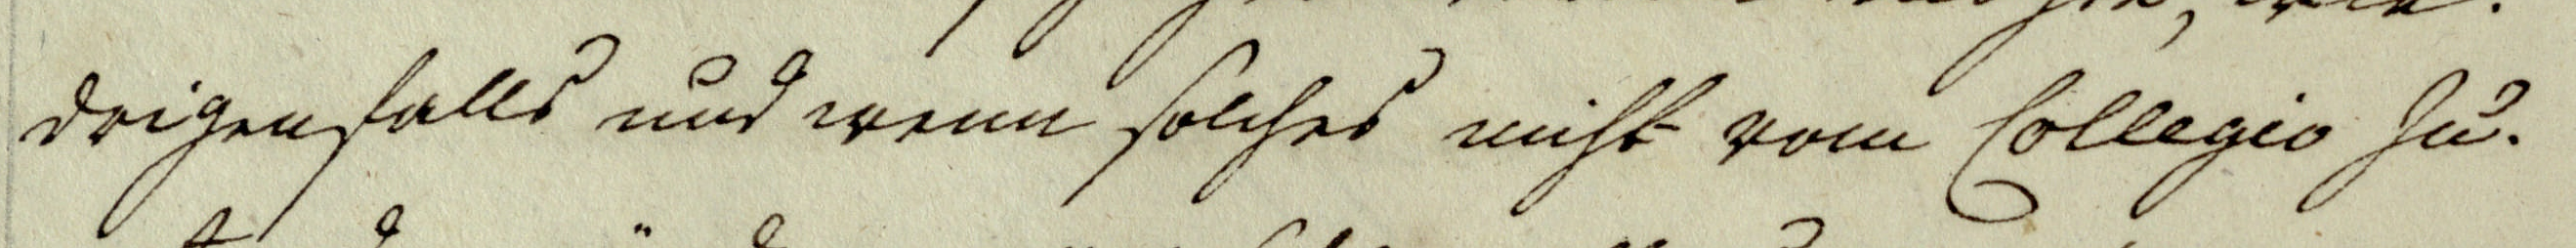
drigenfalls und wenn solches nicht vom Collegio zu¬
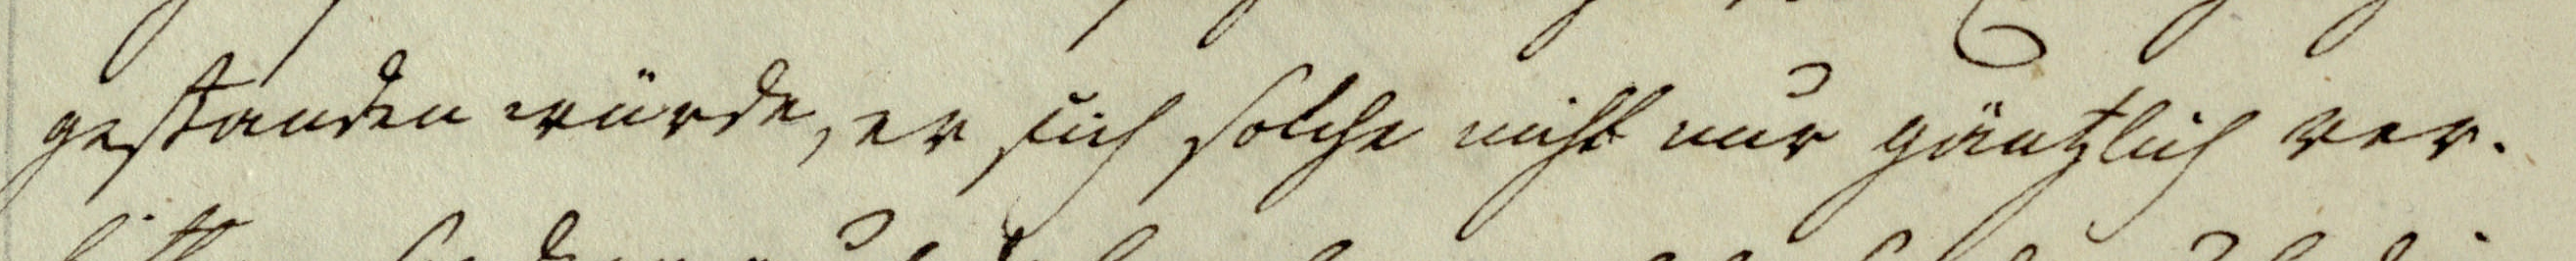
gestanden würde, er sich solche nicht nur gäntzlich ver¬
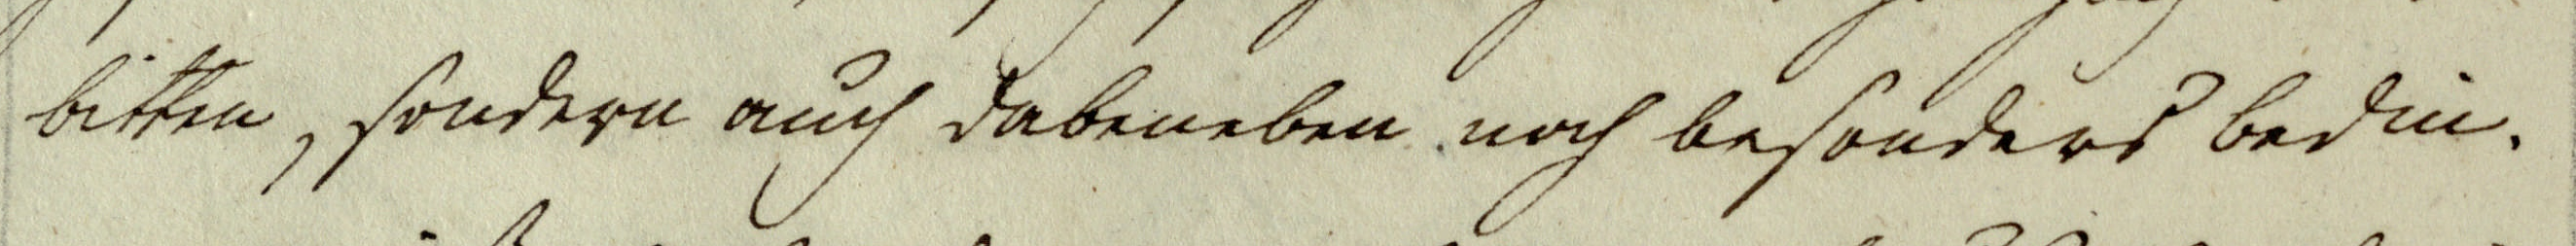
bitten, sondern auch dabeneben noch besonders bedin¬
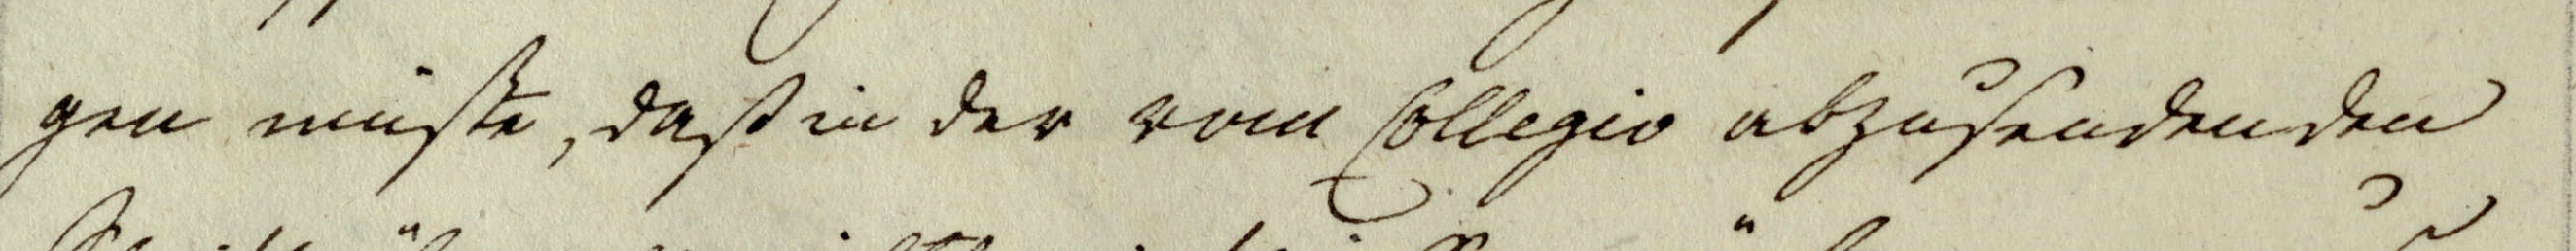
gen müsste, daß in der vom Collegio abzusendenden
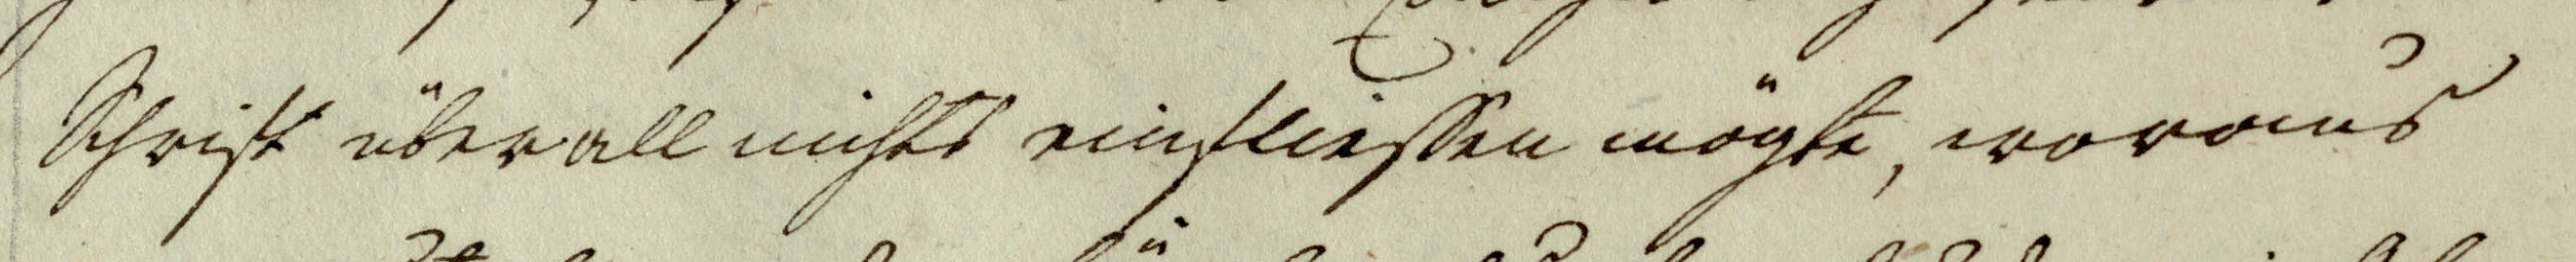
Schrift überall nichts einfliessen mögte, woraus
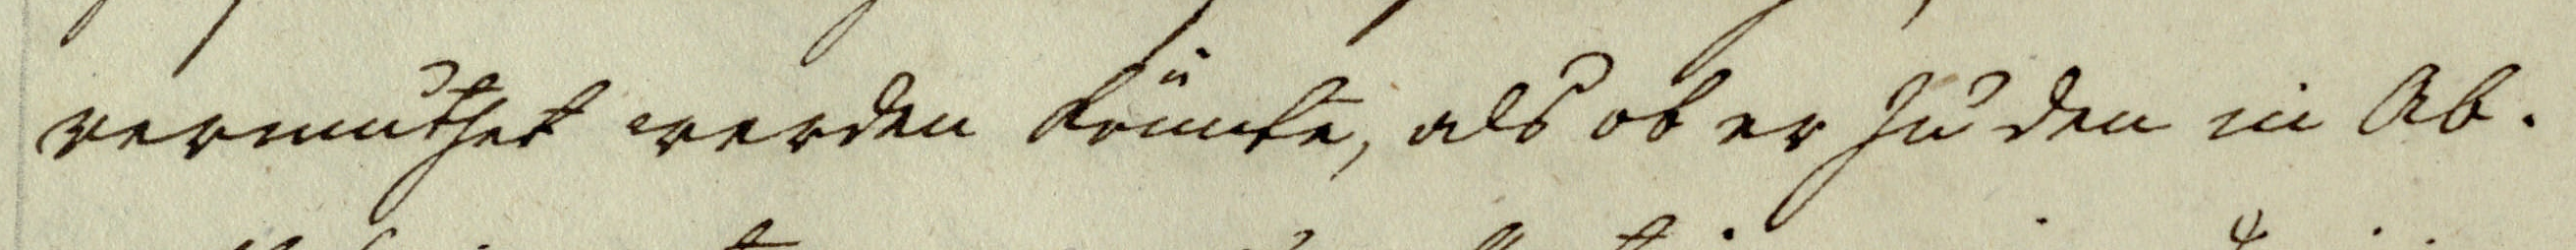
vermuthet werden könnte, als ob er zu den in Ab¬
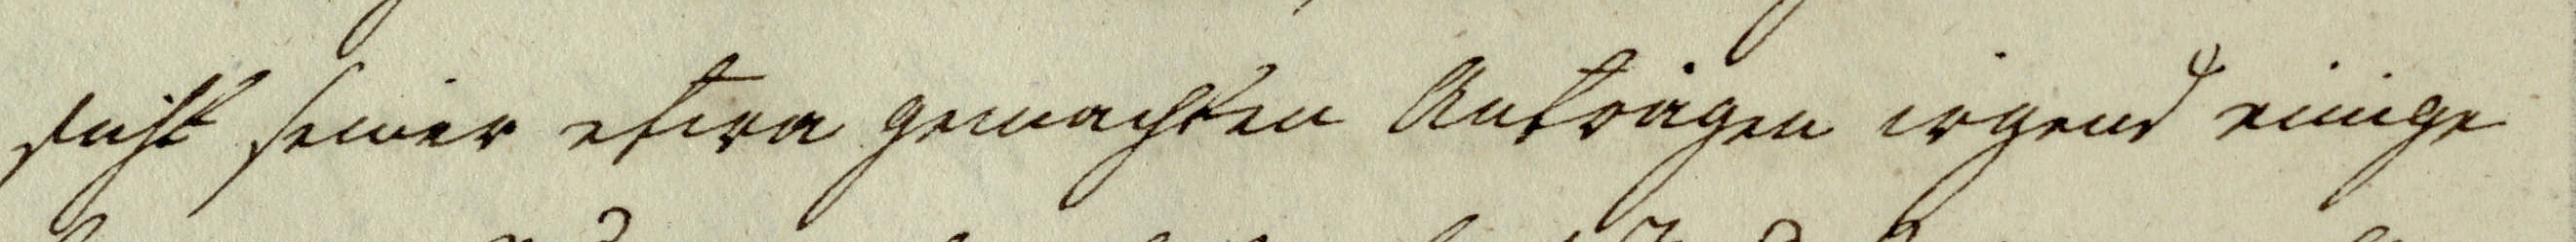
sicht seiner etwa gemachten Anträgen irgend einige
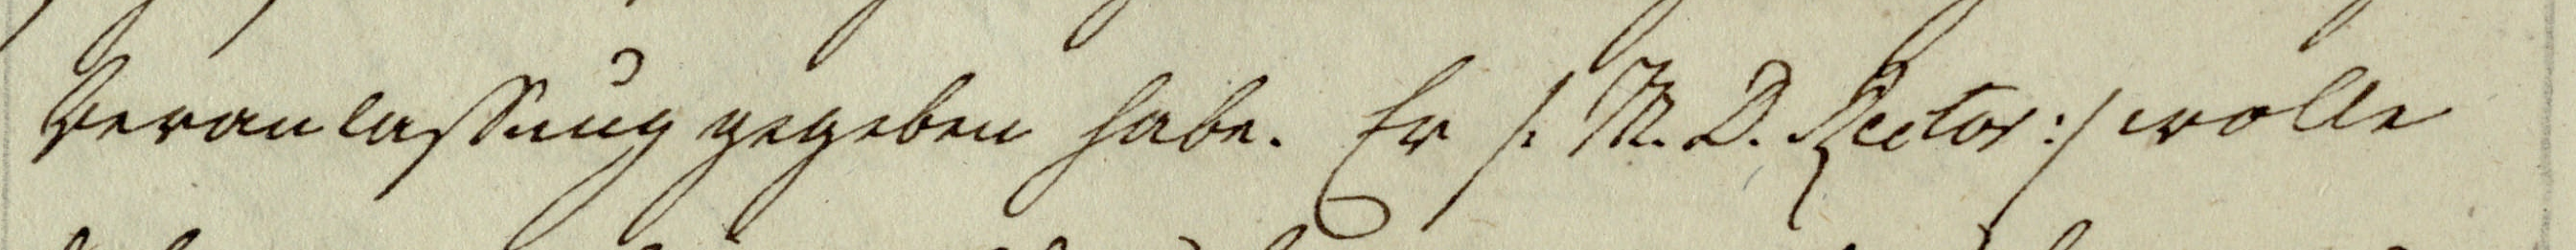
Veranlassung gegeben habe. Er /: M. D. Rector :/ wolle
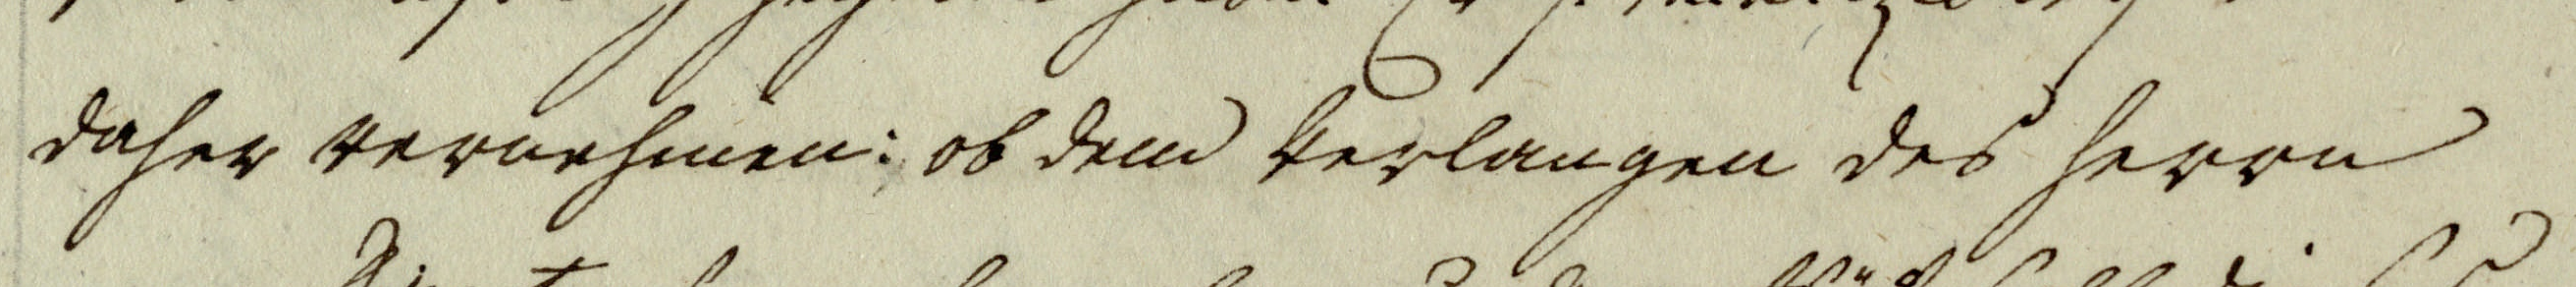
daher vernehmen: ob dem Verlangen des Herrn
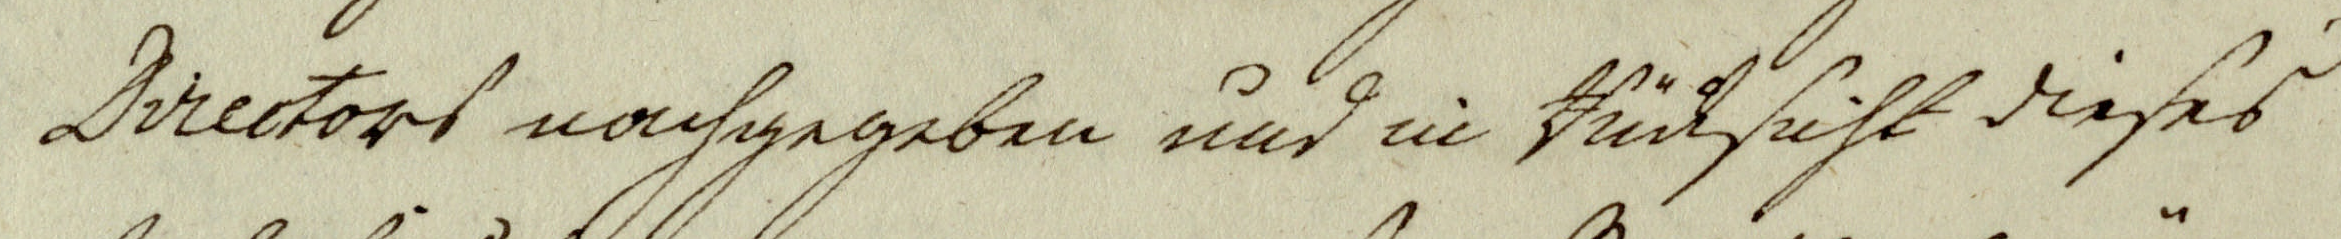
Directors nachgegeben und in Rücksicht dieses
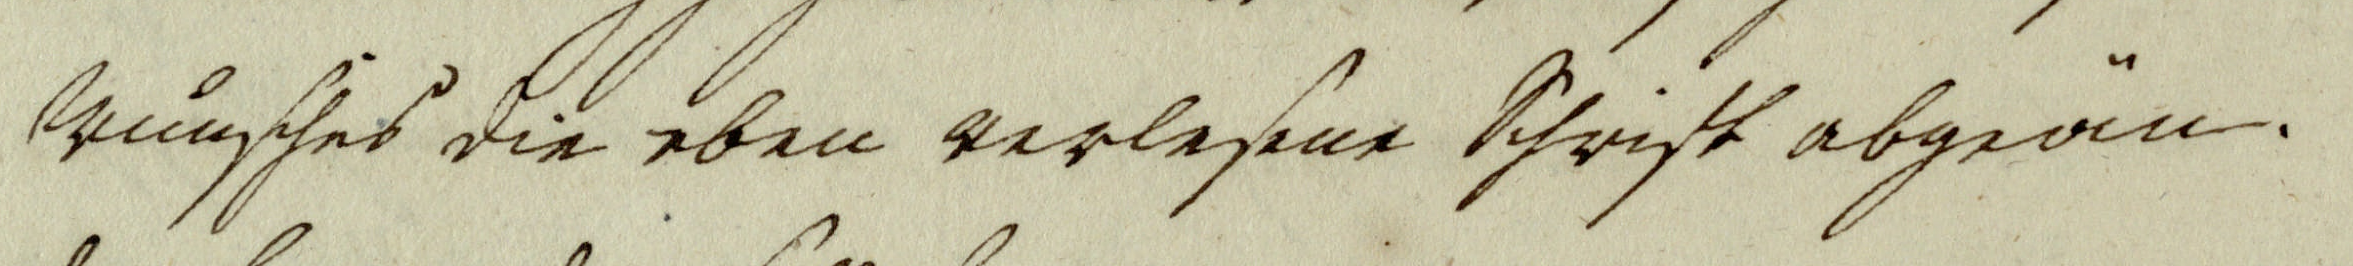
Wunsches die eben verlesene Schrift abgeän¬
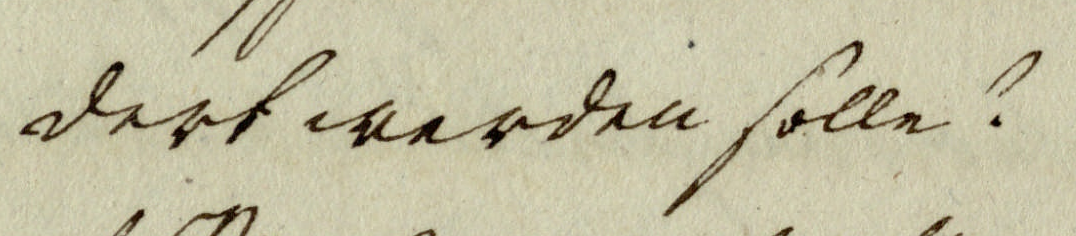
dert werden solle?
